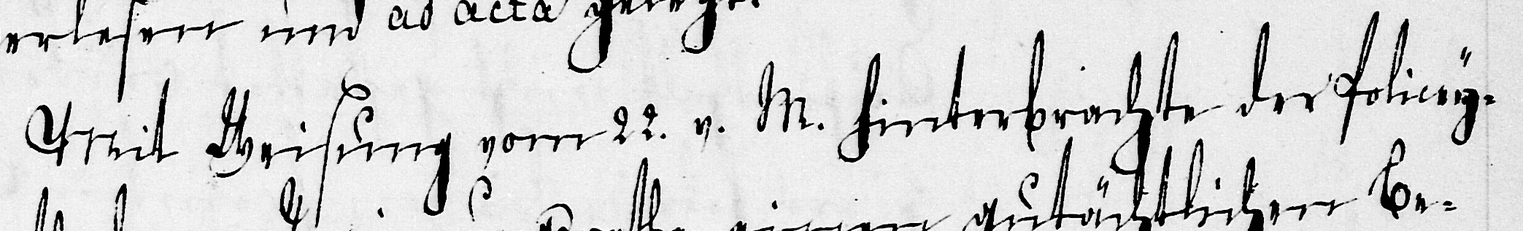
Mit Weisung vom 22. v. M. hinterbrachte der Policey¬
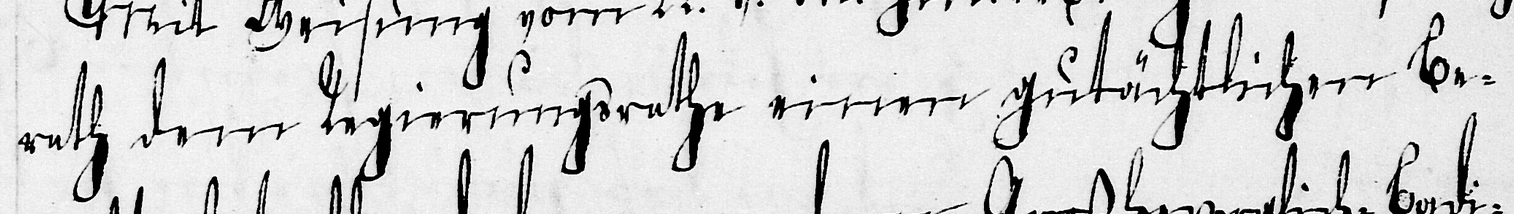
rathe dem Regierungsrathe einen gutächtlichen Be¬
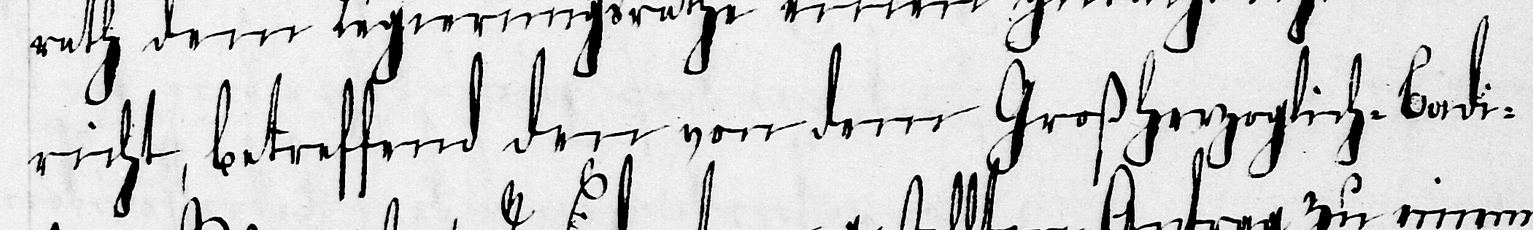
richt, betreffend den von dem Großherzoglich-Badi¬
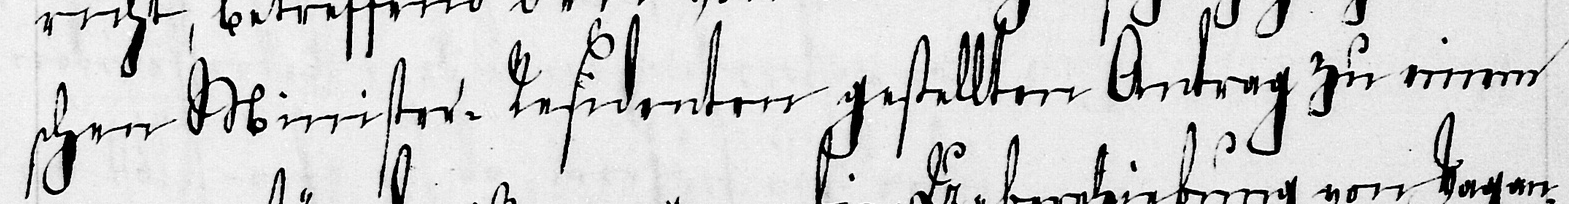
schen Minister-Residenten gestellten Antrag zu einem
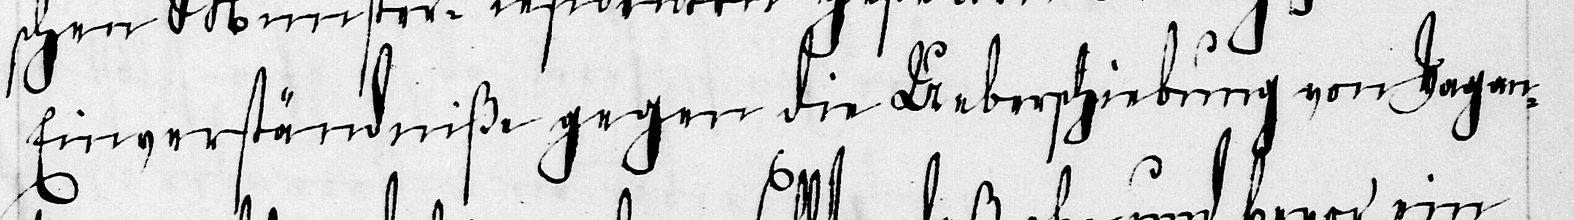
Einverständniße gegen die Ueberschiebung von Vagan¬
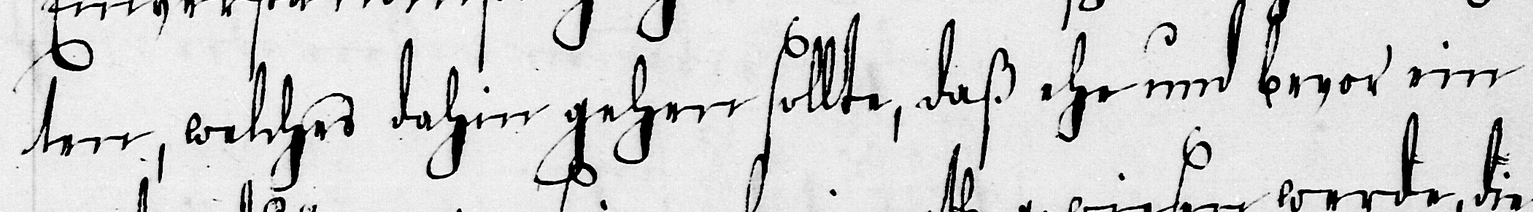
ten, welches dahin gehen sollte, daß ehe und bevor ein
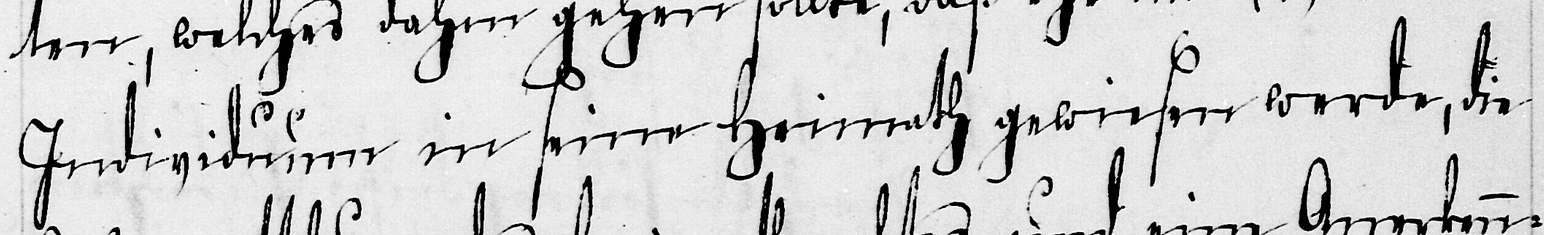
Individuum in seine Heimath gewiesen werde, die
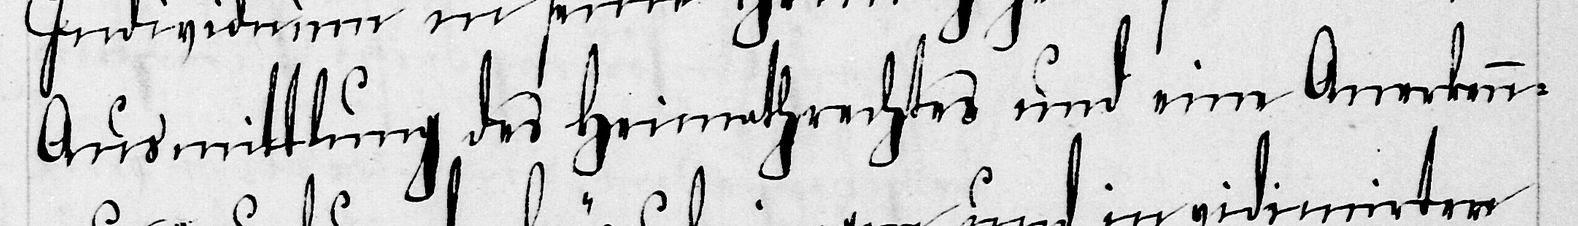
Ausmittlung des Heimathrechtes und eine Anerken¬
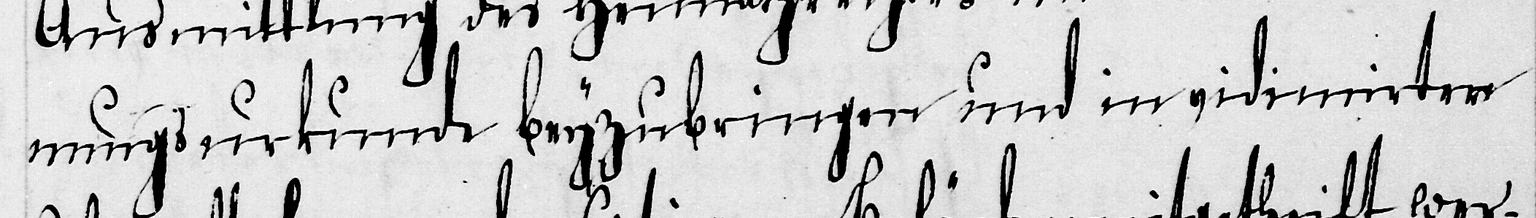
nungsurkunde beyzubringen und in vidimirter
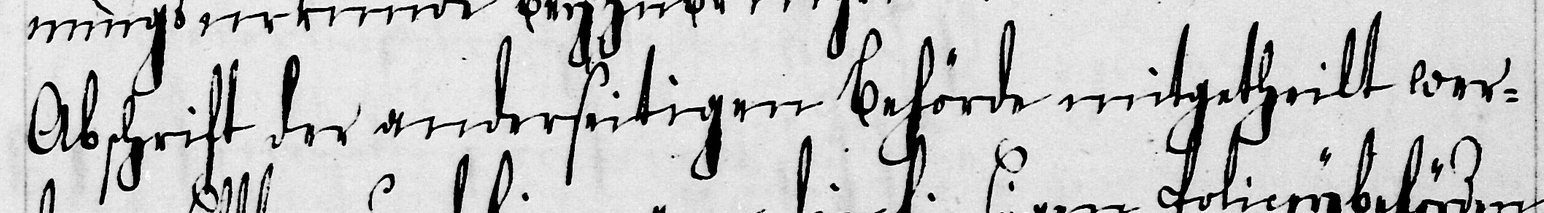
Abschrift der anderseitigen Behörde mitgetheilt wer¬
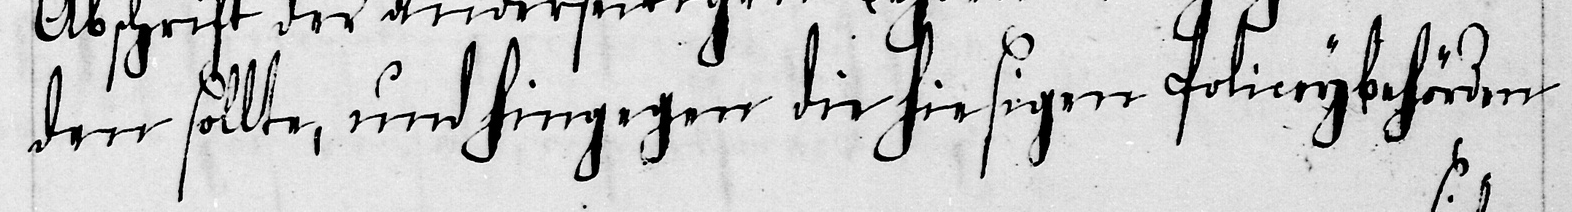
den sollte, und hingegen die hiesigen Policeybehörden
